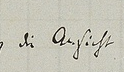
die Ansicht
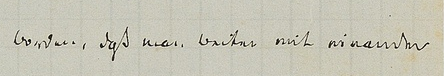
worden, daß man weiter mit einander
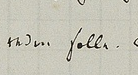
reden solle.
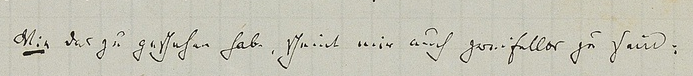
Wie das zu geschehen habe, scheint mir auch zweifellos zu sein:
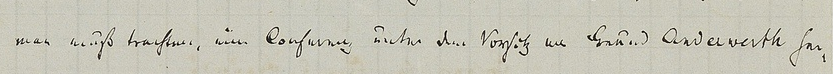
man muß trachten, eine Conferenz unter dem Vorsitz von Freund Anderwerth her-
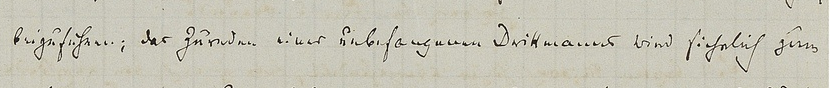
beizuführen; das Zureden eines unbefangenen Drittmannes wird sicherlich zum
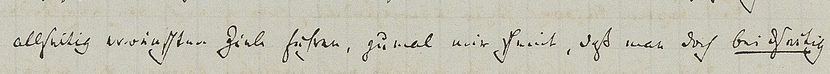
allseitig erwünschten Ziele führen, zumal mir scheint, daß man doch beidseitig
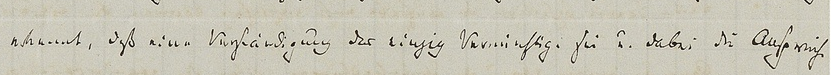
erkennt, daß eine Verständigung das einzig Vernünftige sei u. dabei die Ansprüche
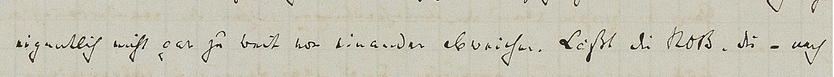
eigentlich nicht gar zu weit von einander abweichen. Läßt die NOB. die – nach
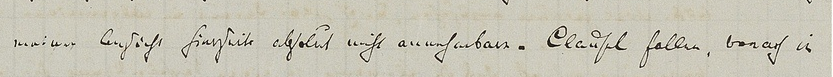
meiner Ansicht hierseits absolut nicht annehmbare – Clausel fallen, wonach im
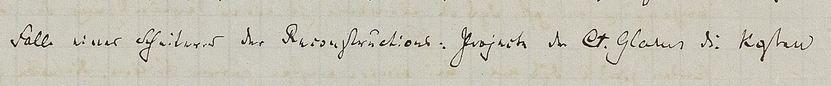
Falle eines Scheiterns der Reconstructions-Projekte der Ct. Glarus die Kosten
